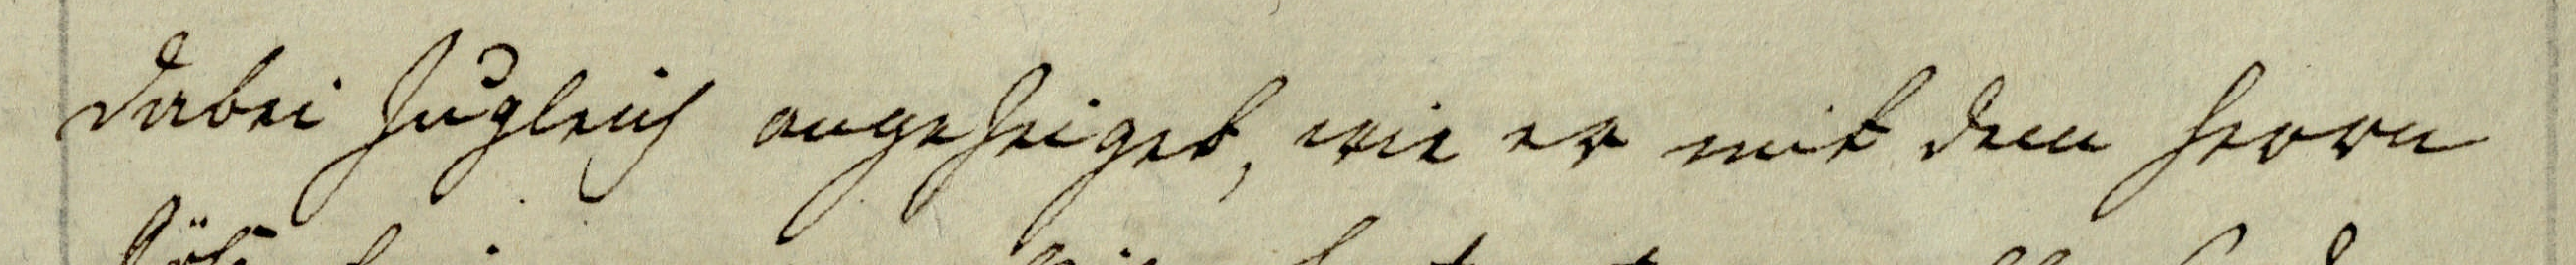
dabei zugleich angezeiget, wie er mit dem Herrn
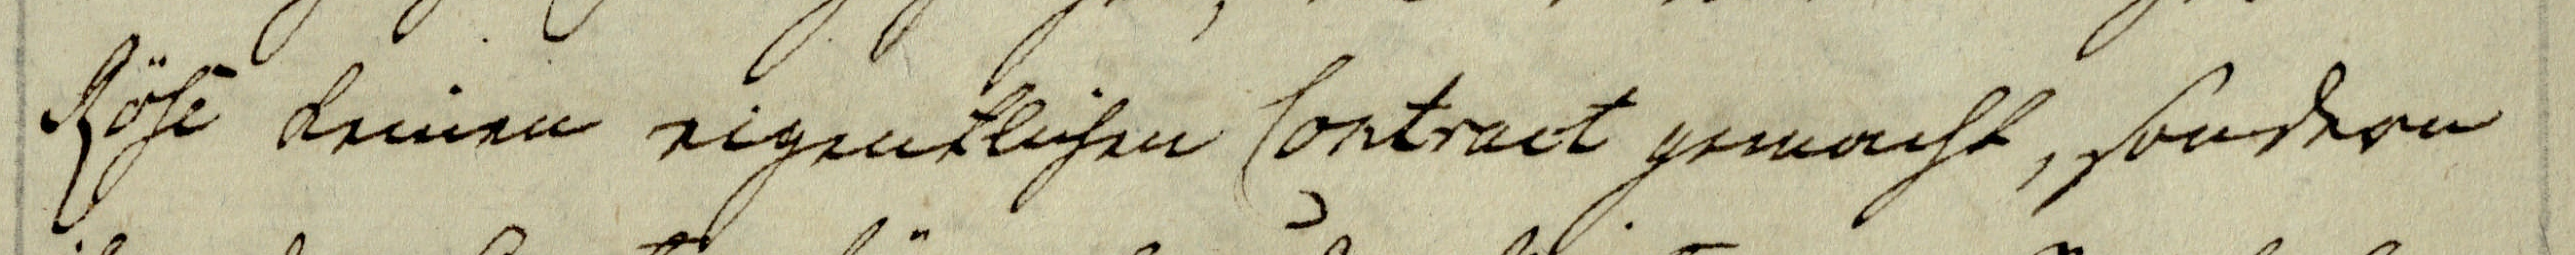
Röse keinen eigentlichen Contract gemacht, sondern
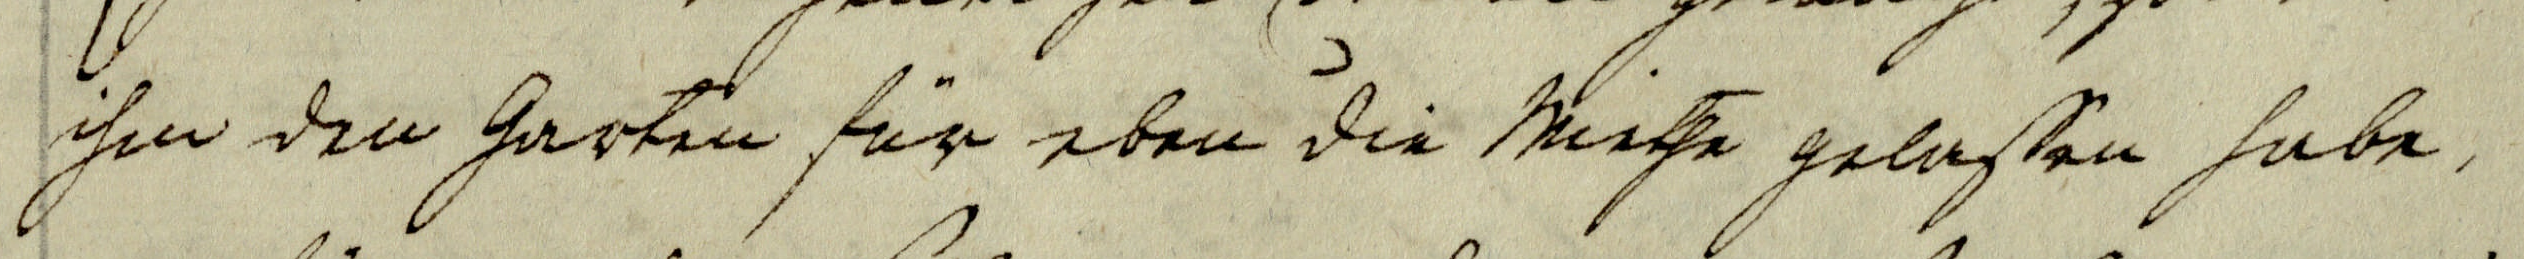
ihm den Garten für eben die Miethe gelassen habe,
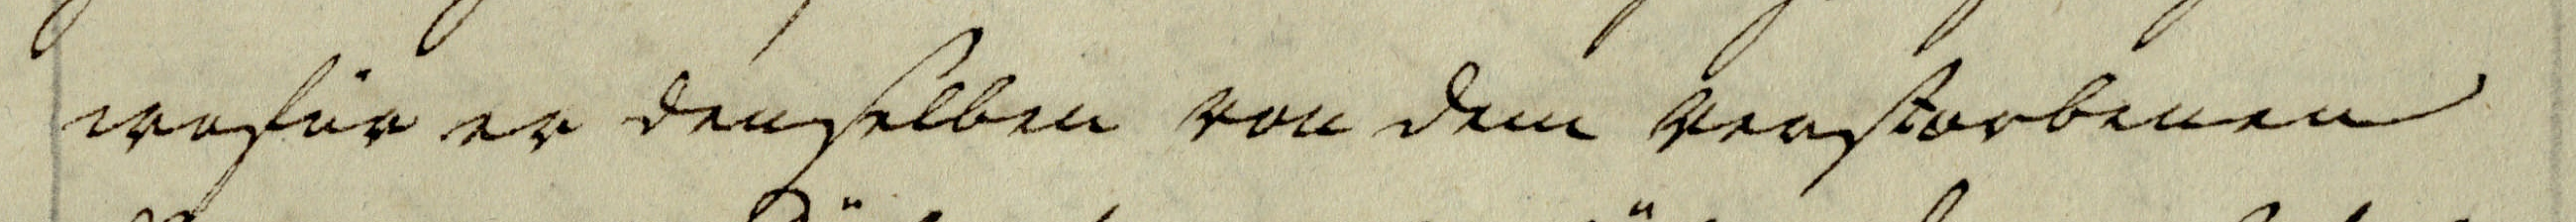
wofür er denselben von dem verstorbenen
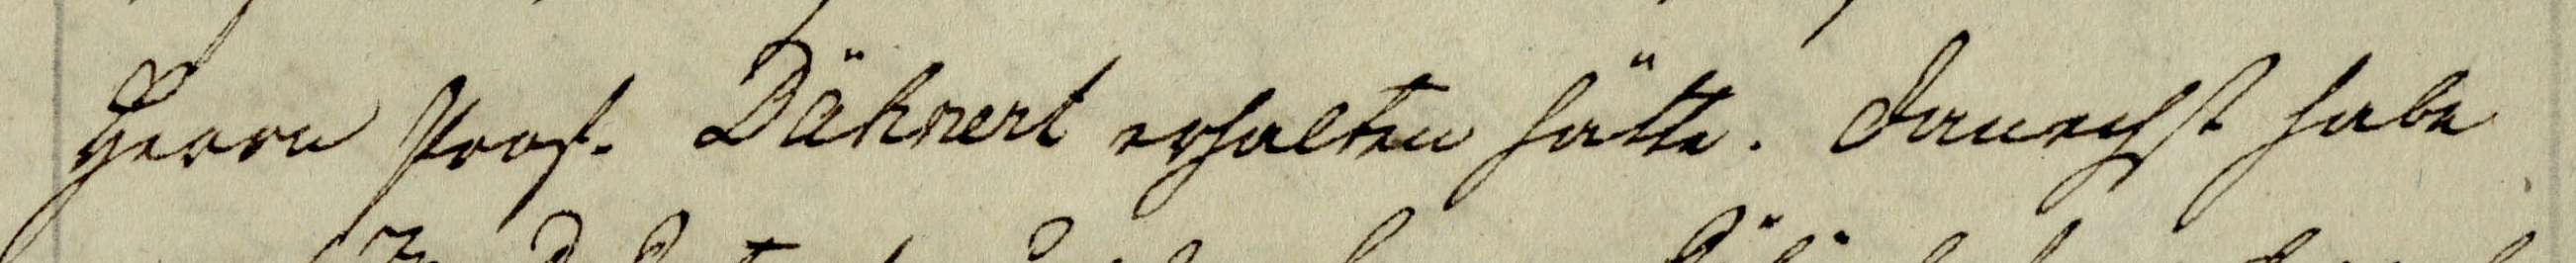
Herrn Prof. Dähnert erhalten hätte. Danechst habe
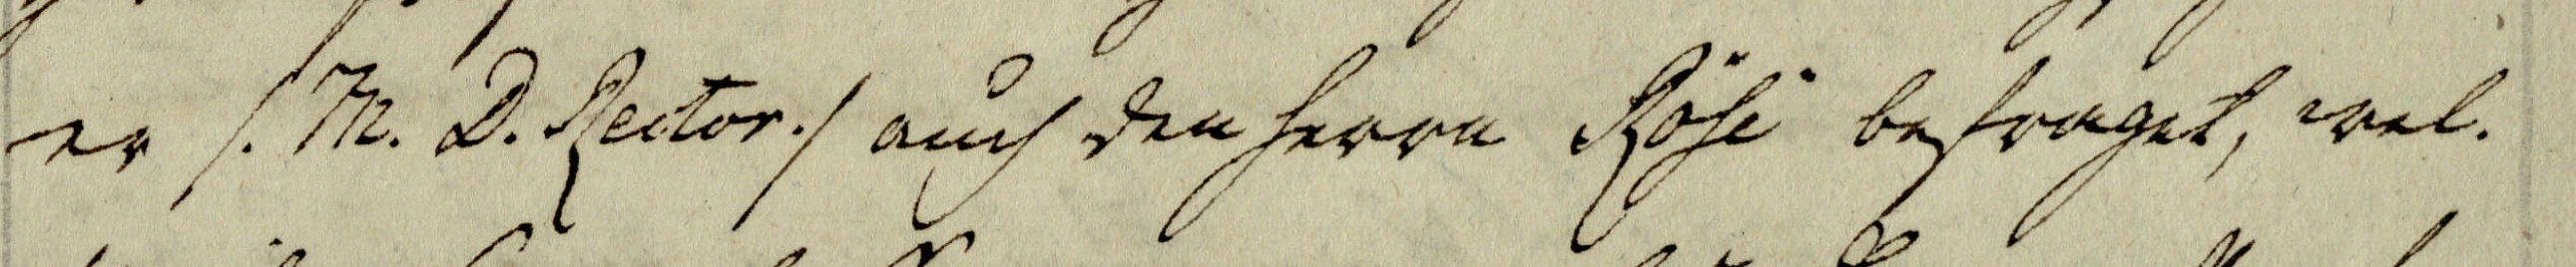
er /. M. D. Rector ./ auch den Herrn Röse befraget, wel¬
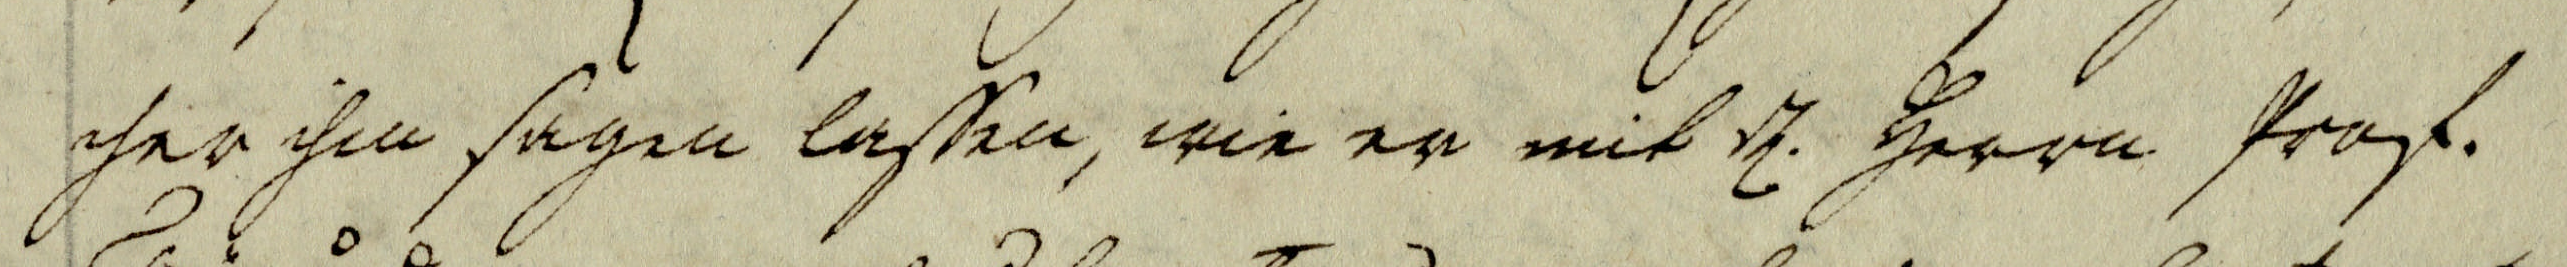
cher ihm sagen lassen, wie er mit dh. Herrn Prof.
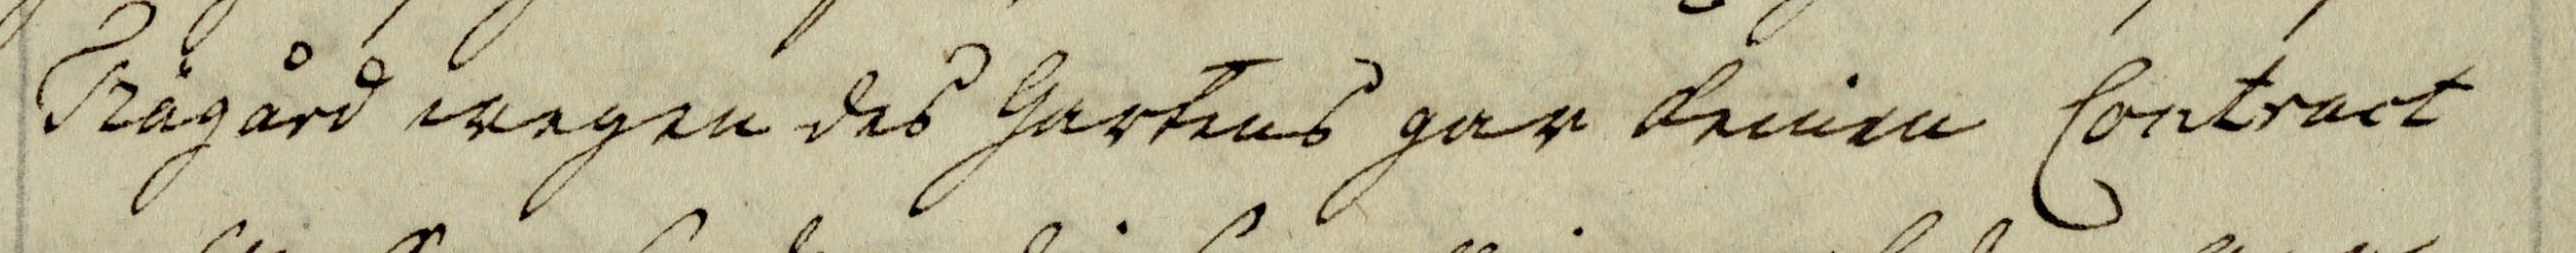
Trägård wegen des Gartens gar keinen Contract
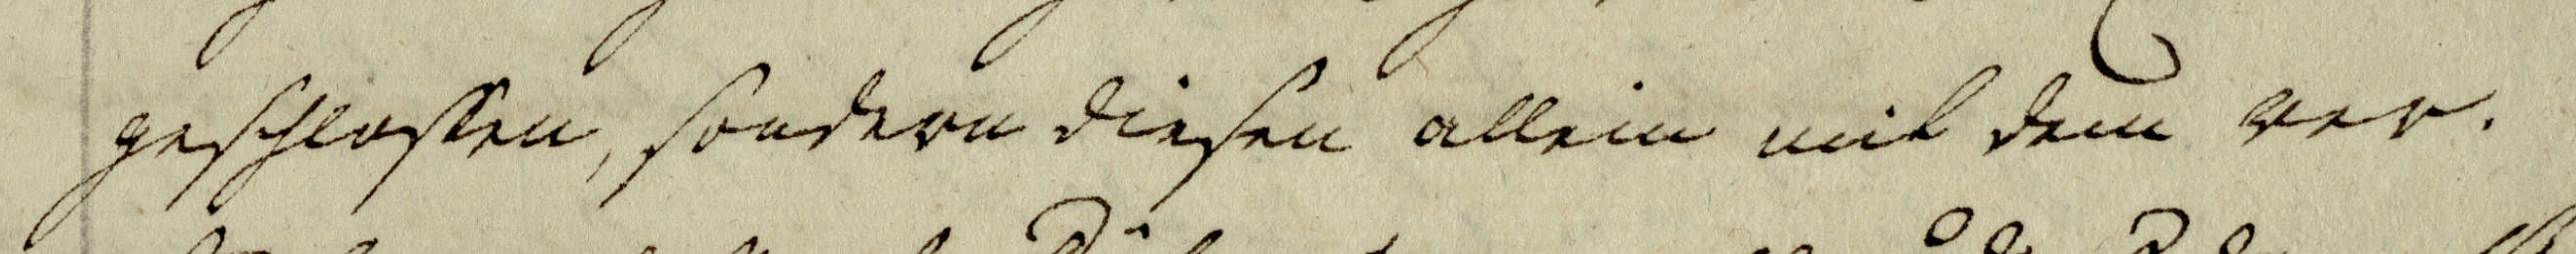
geschlossen, sondern diesen allein mit dem ver¬
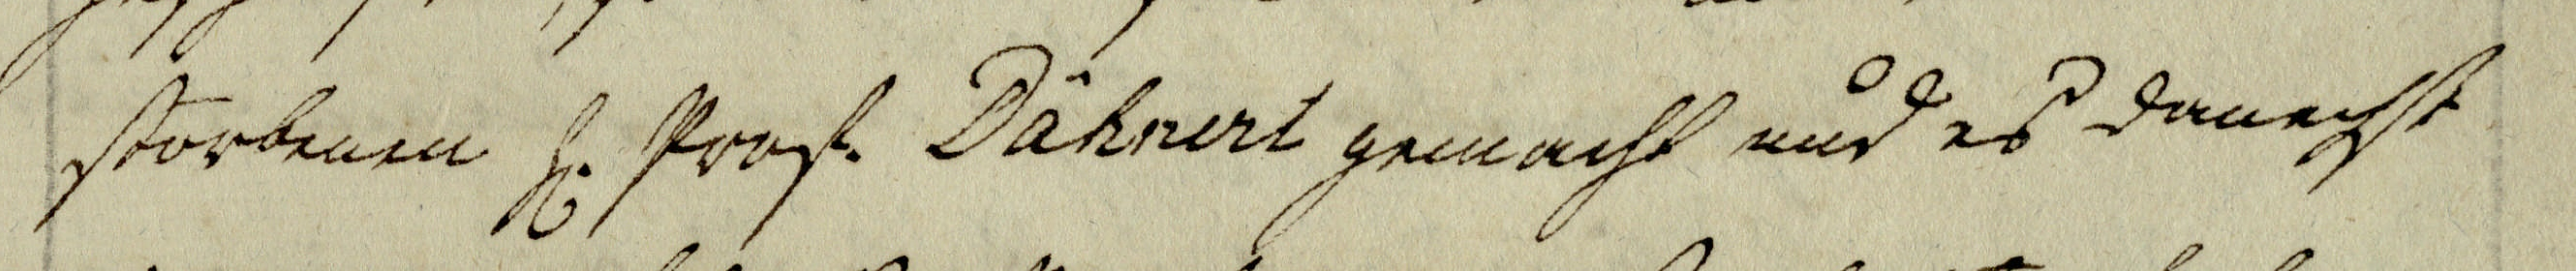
storbenen H. Prof. Dähnert gemacht und es danechst
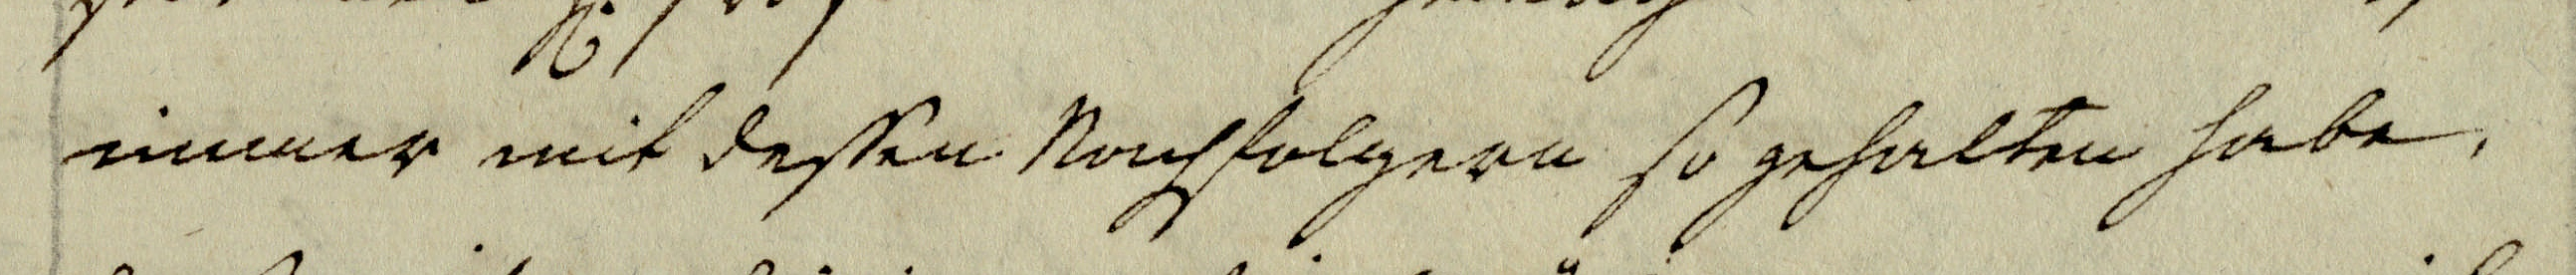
immer mit dessen Nachfolgern so gehalten habe,
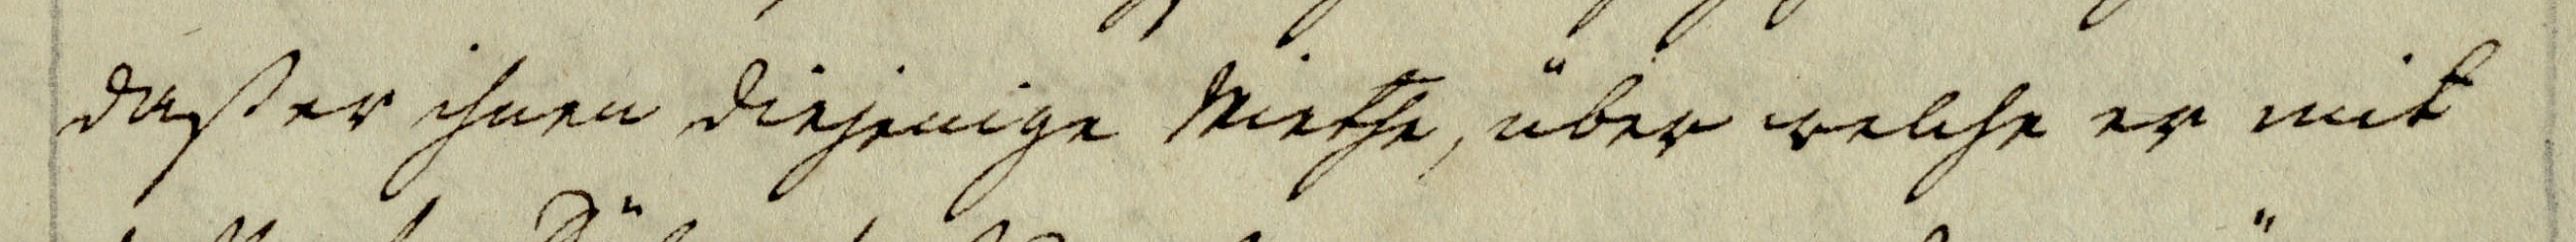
daß er ihnen diejenige Miethe, über welche er mit
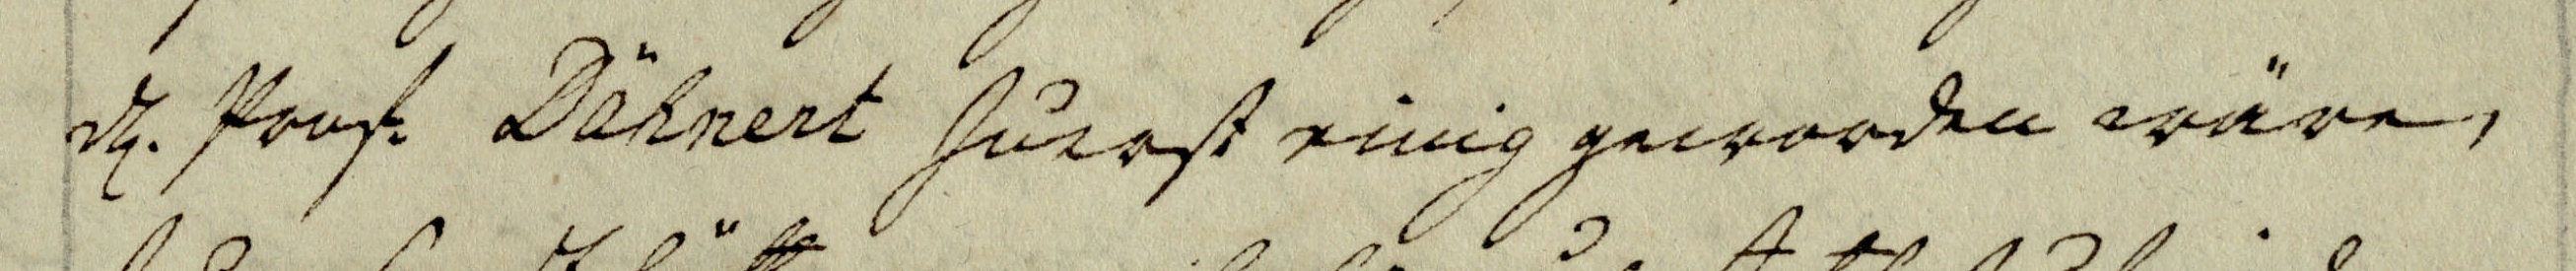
dh. Prof. Dähnert zuerst einig geworden wäre,
